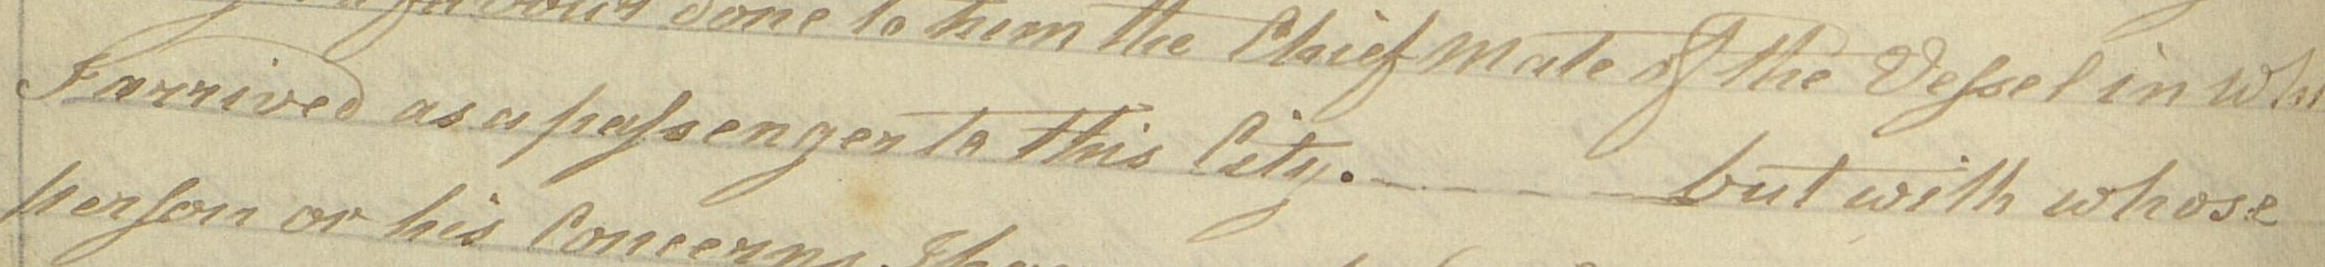I arrived as a passenger to this City. but with whose
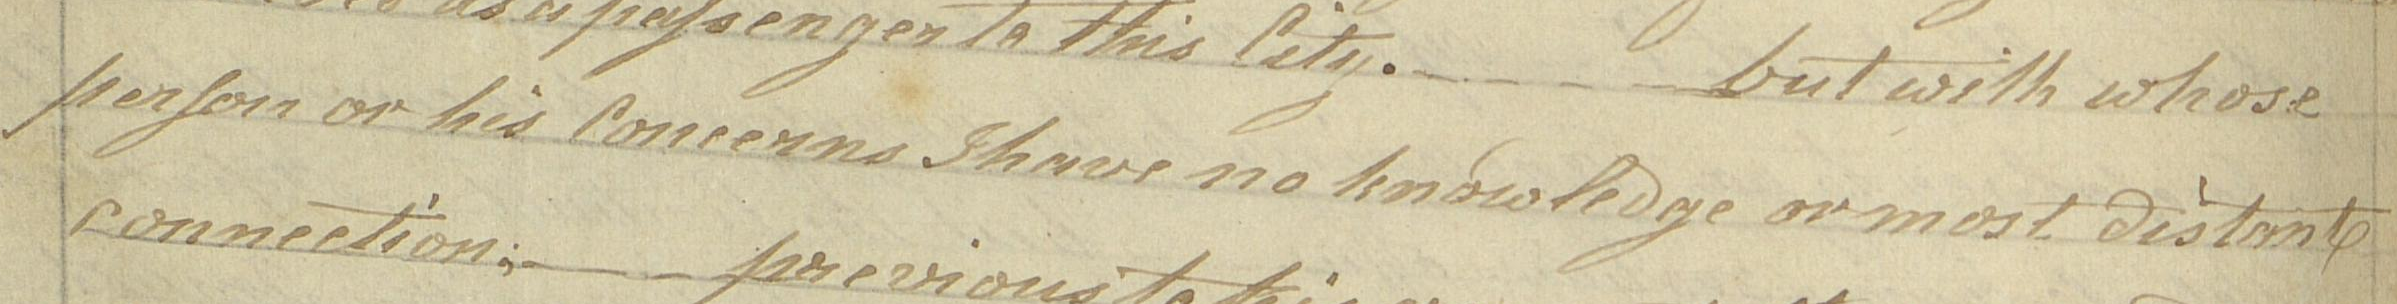person or his Concerns I have no knowledge or most distant
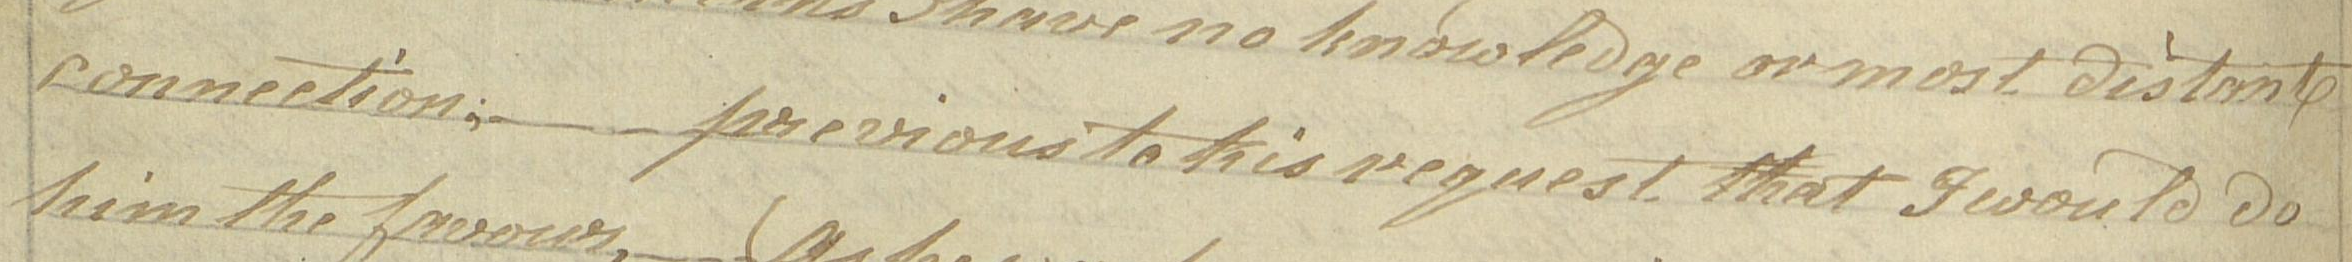connection; previous to his request that I would do
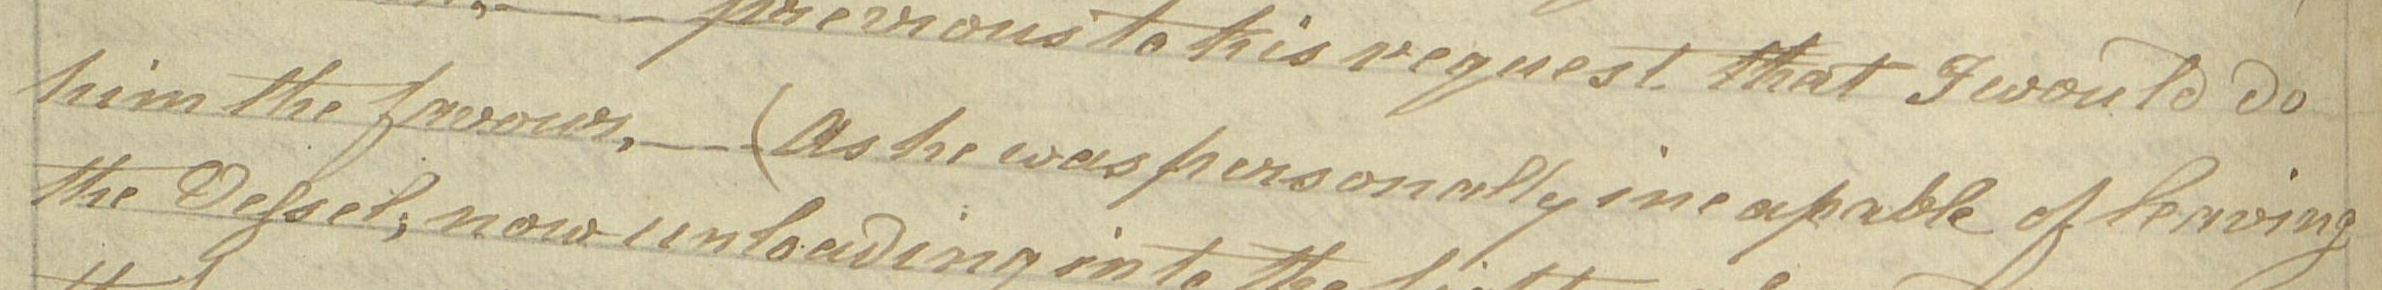him the favour, (As he was personally incapable of leaving
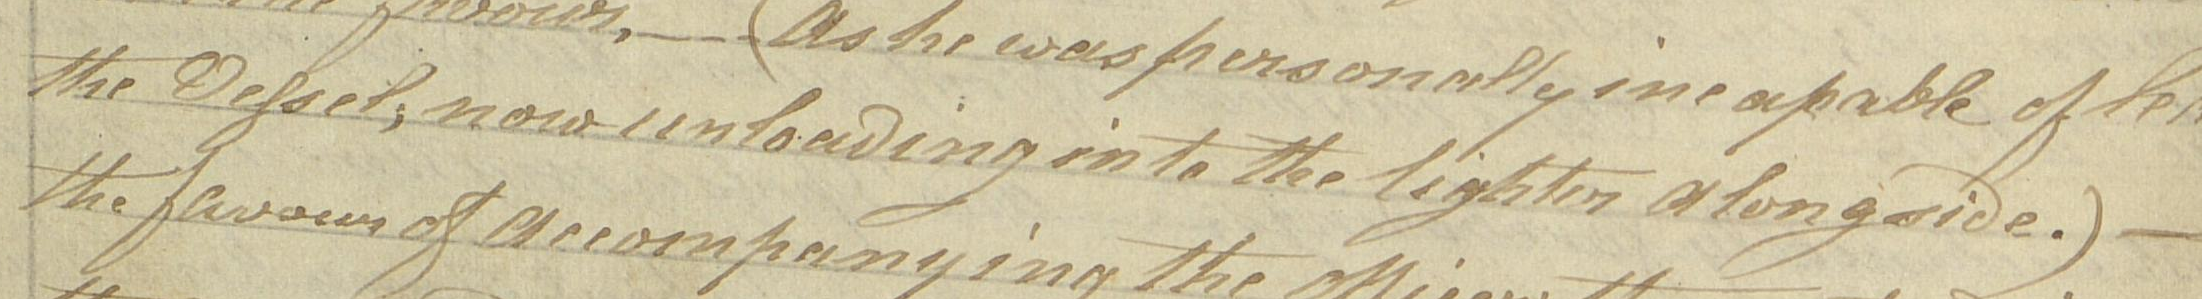the Vessel; now unloading into the lighter Alongside.)
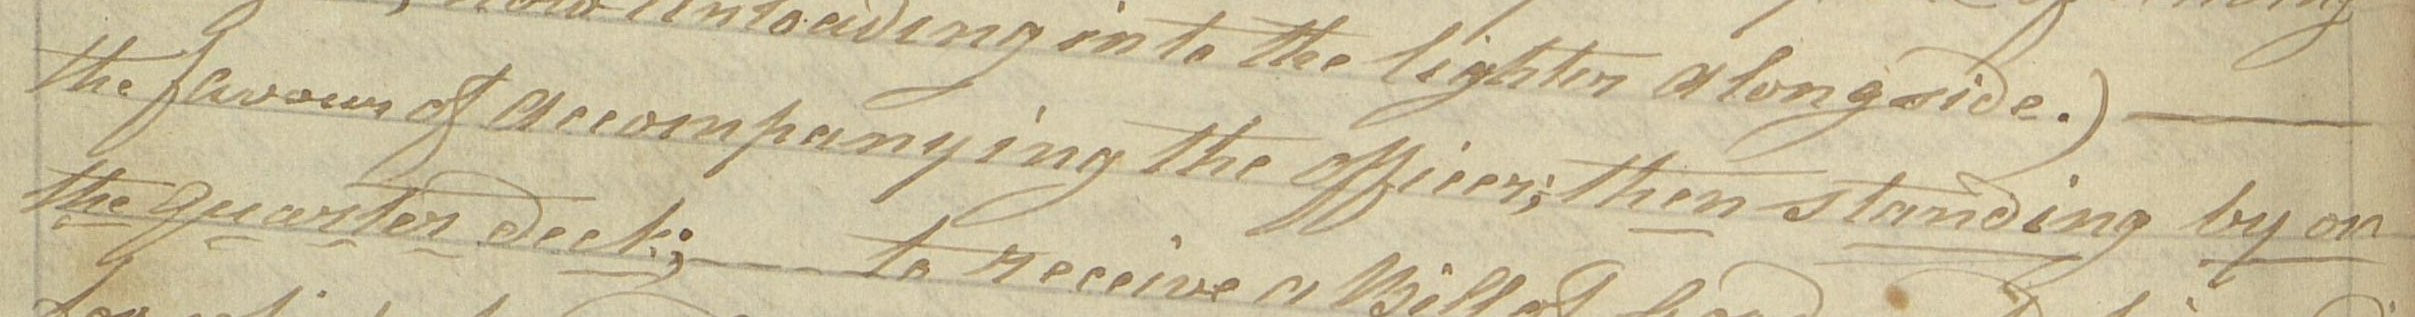the favour of accompanying the Officer; then standing by on
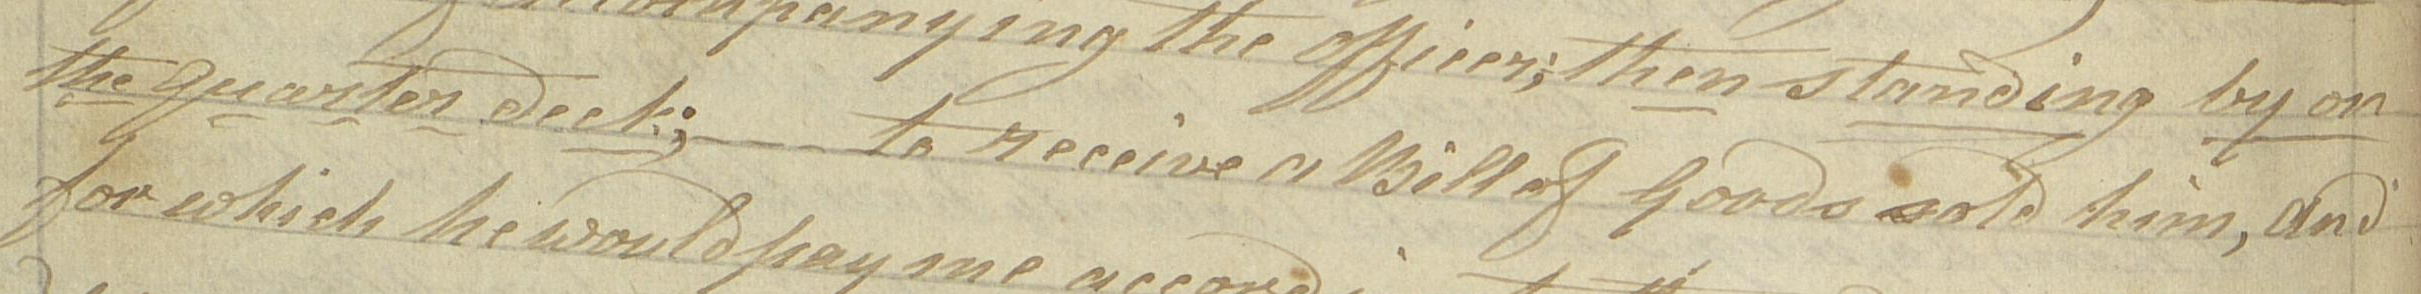the quarter deck; to receive Bill of Goods sold him, and
